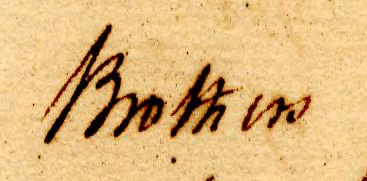Brothers
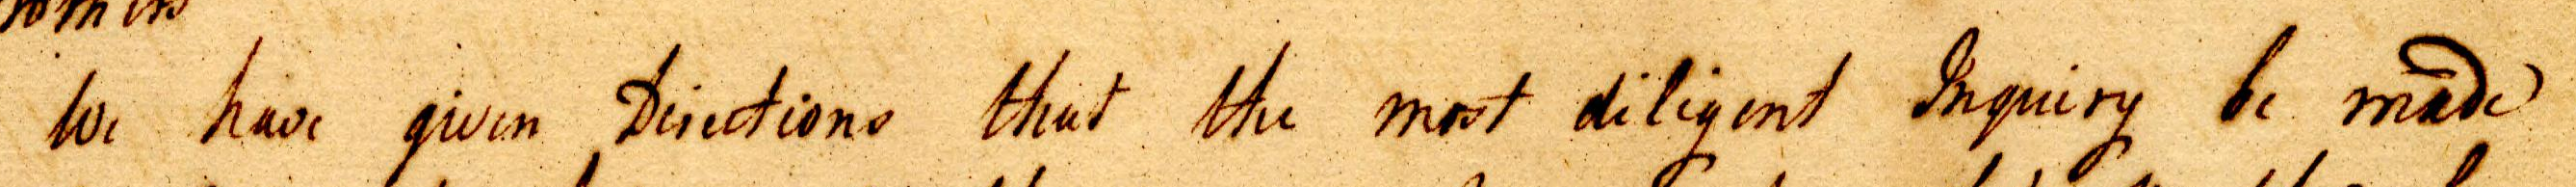We have given Directions that the most diligent Inquiry be made
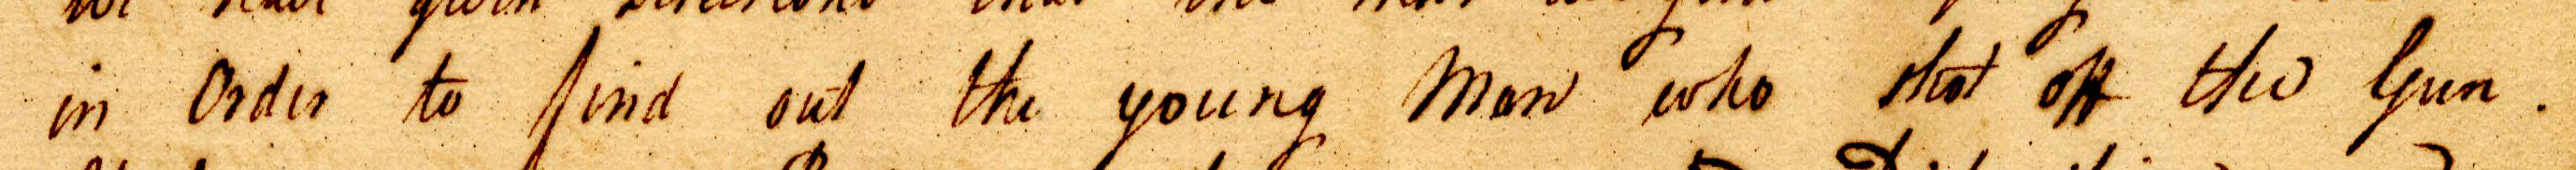in Order to find out the young Man who shot off the Gun.
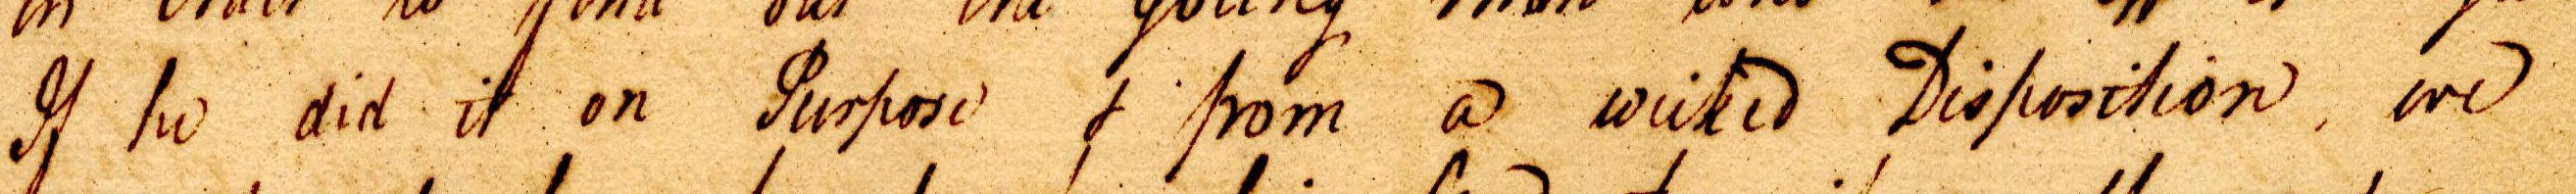If he did it on Purpose & from a wicked Disposition, we
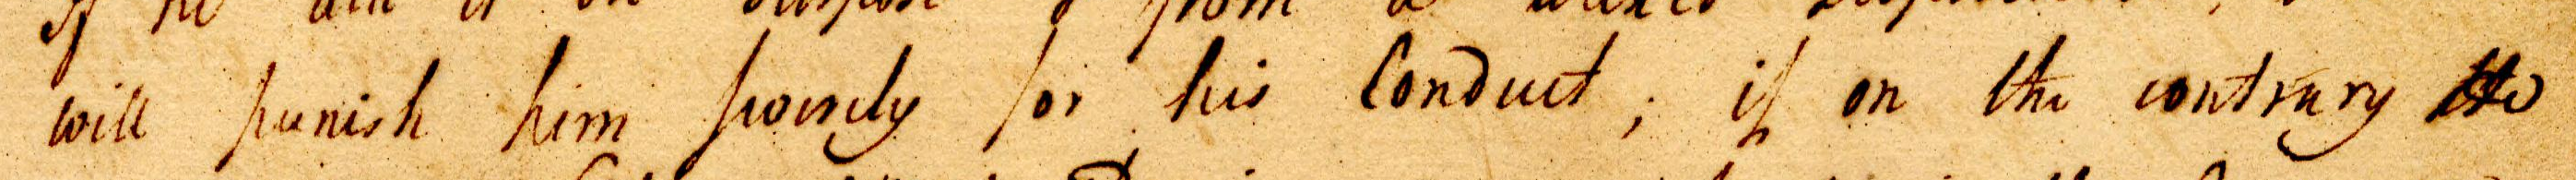will punish him severely for his Conduct; if on the contrary he
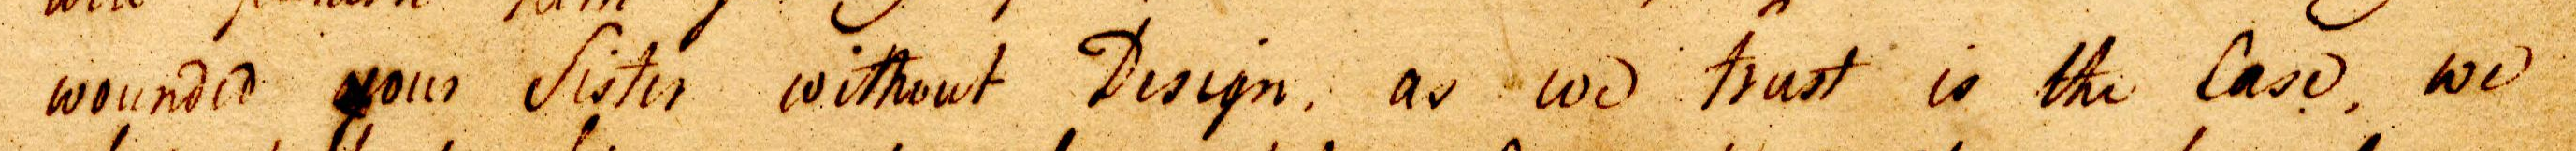wounded your Sister without Design, as we trust is the case, we
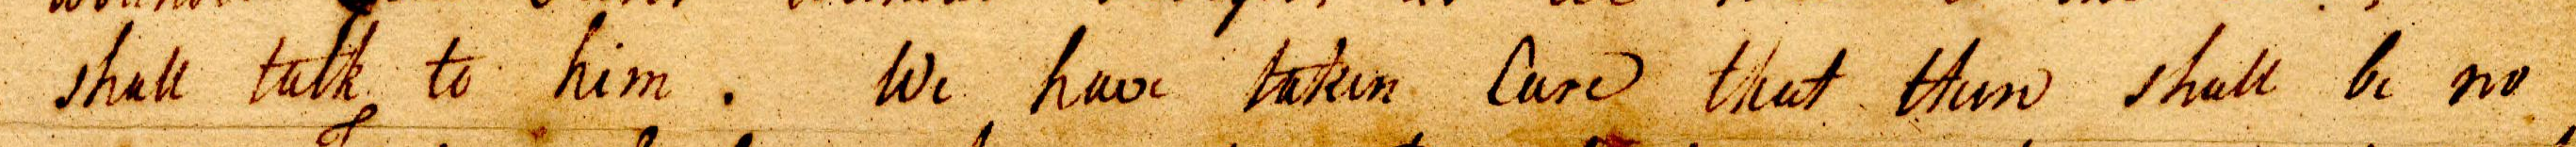shall talk to him. We have taken care that then shall be no
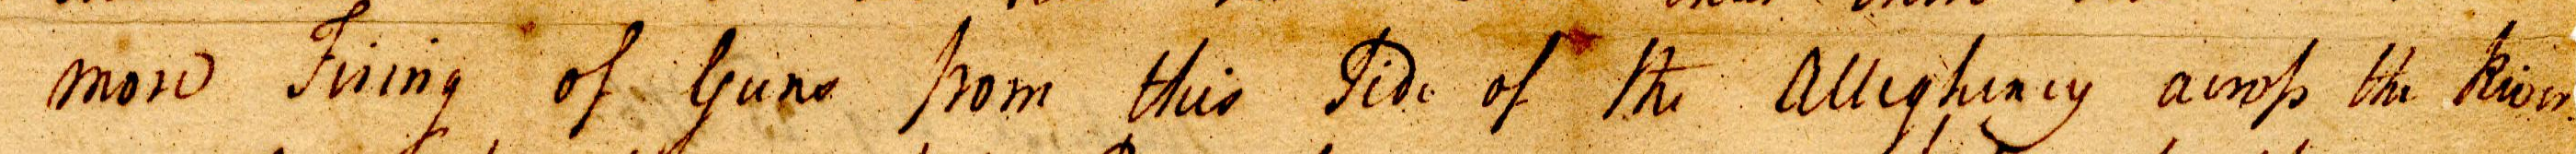more Firing of Guns from this Side of the Allegheny across the River.
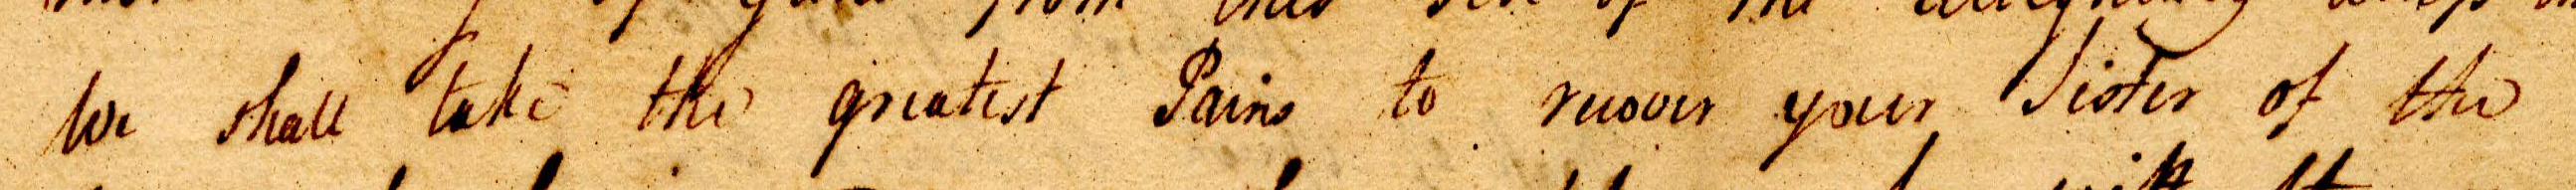We shall take the greatest Pains to recover your Sister of the
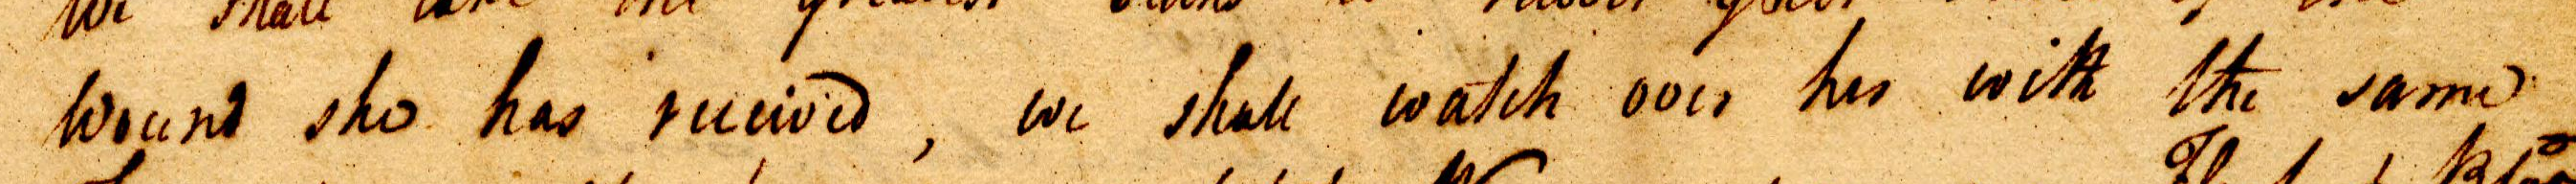wound she has received, we shall watch over her with the same
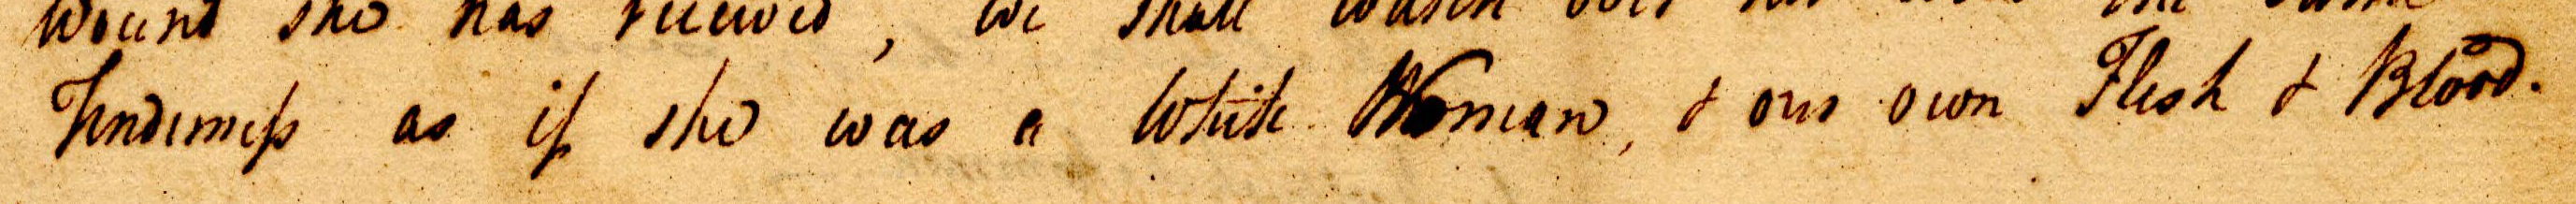Tenderness as if she was a White Woman, & our own Flesh & Blood.
